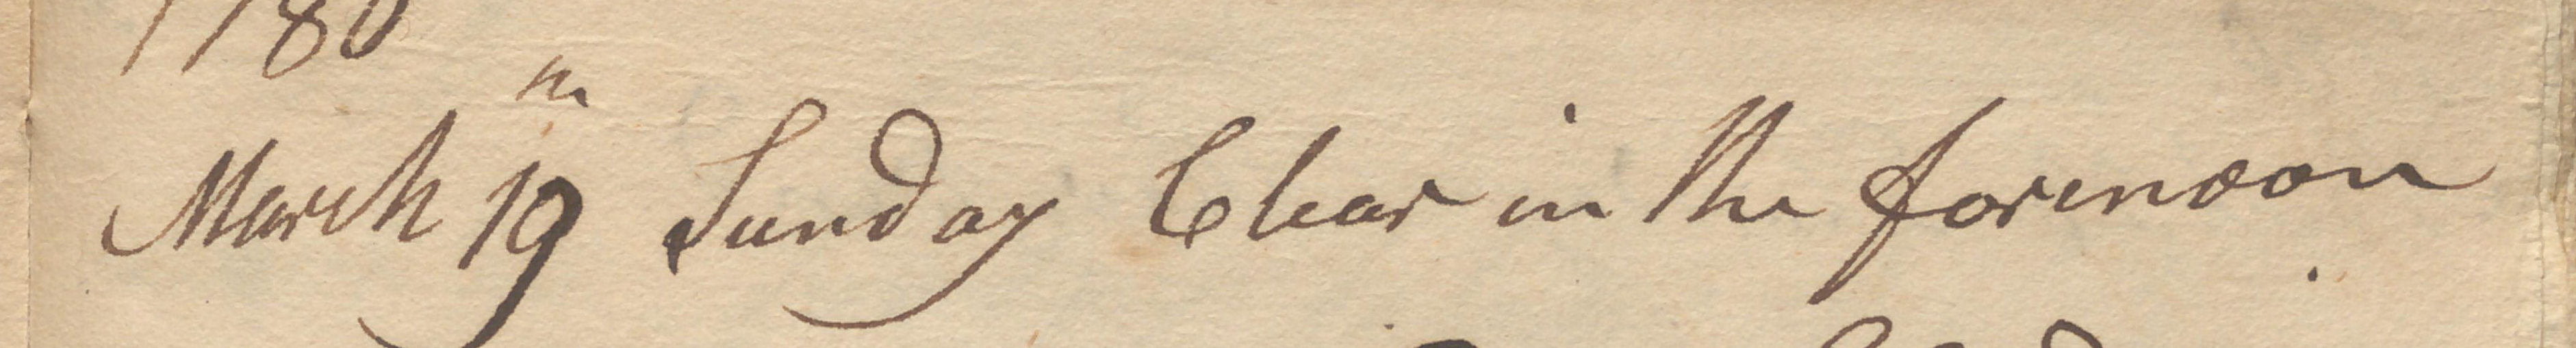March 19^th Sunday Clear in the forenoon
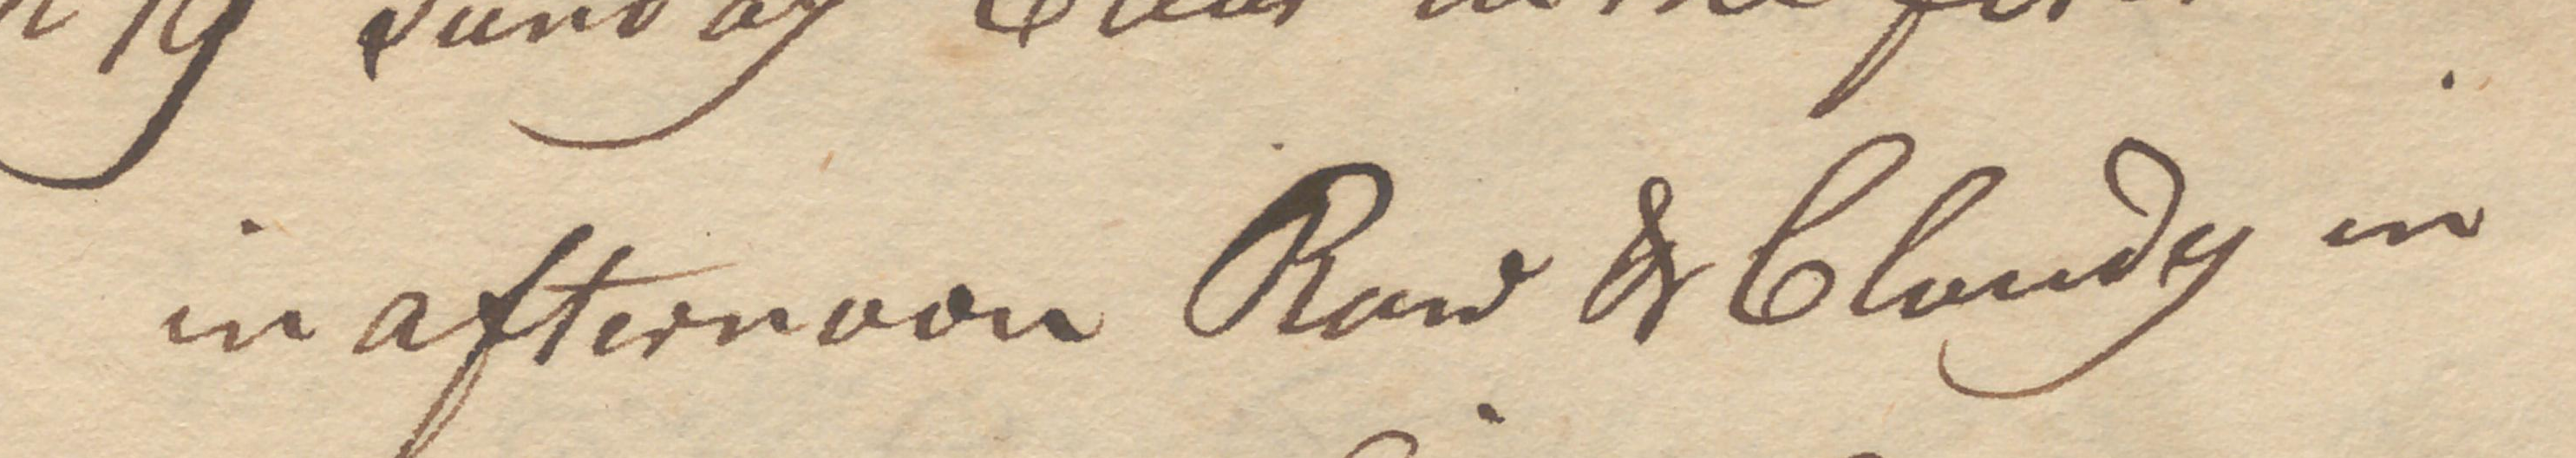in afternoon Raw & Cloudy in
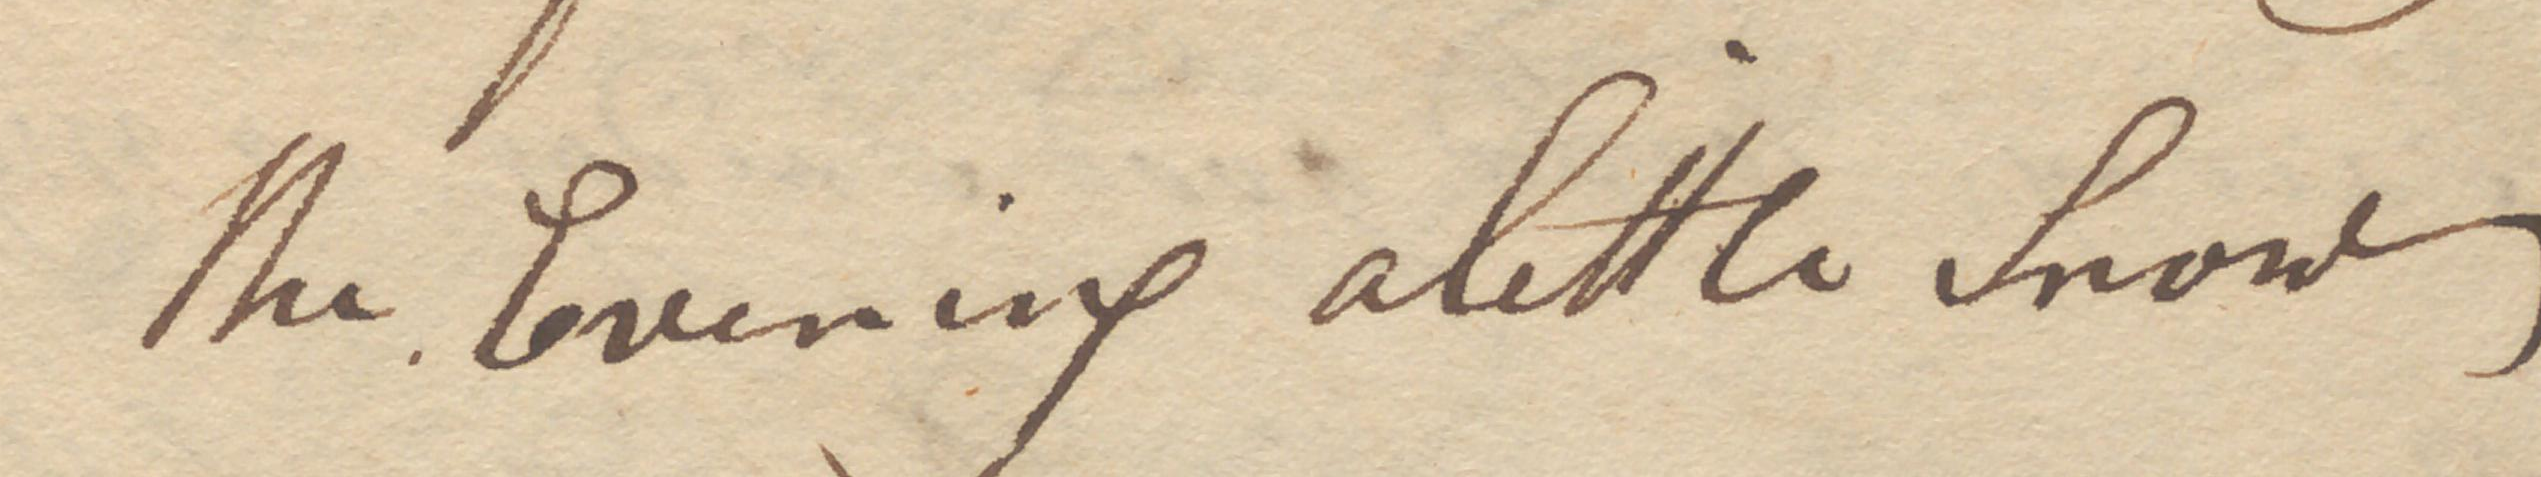the Evening a little snow
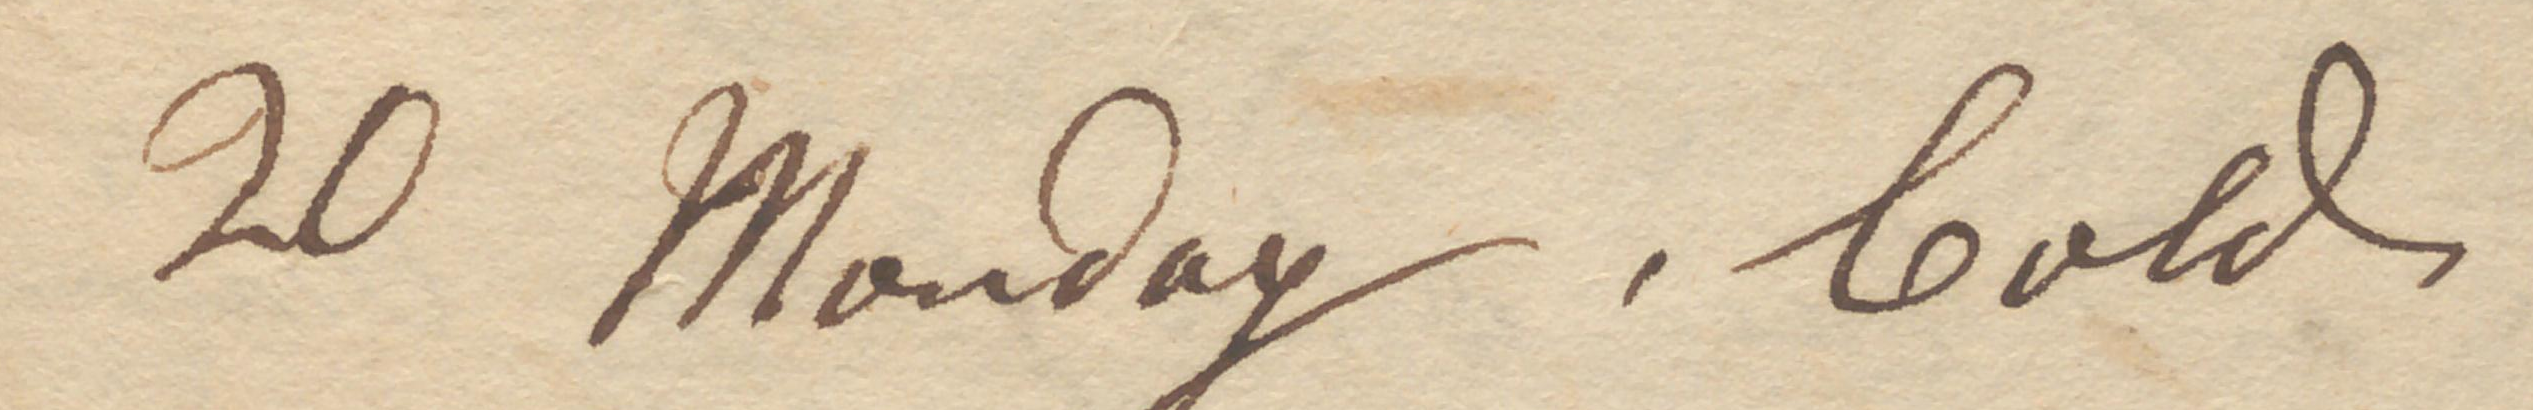2 Monday, Cold
